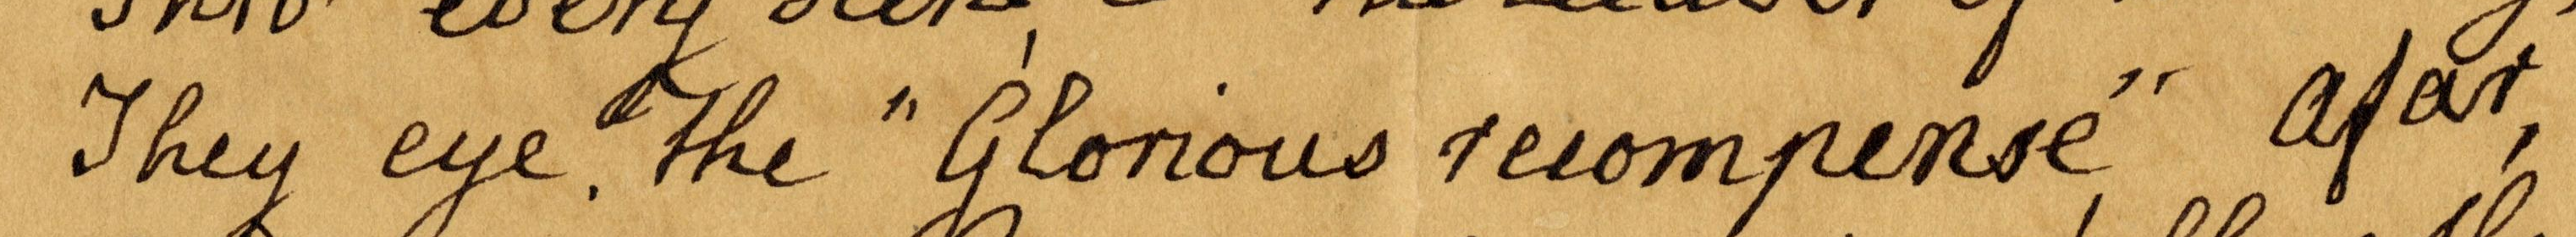They eye, The "Glorious recompense," Afar,
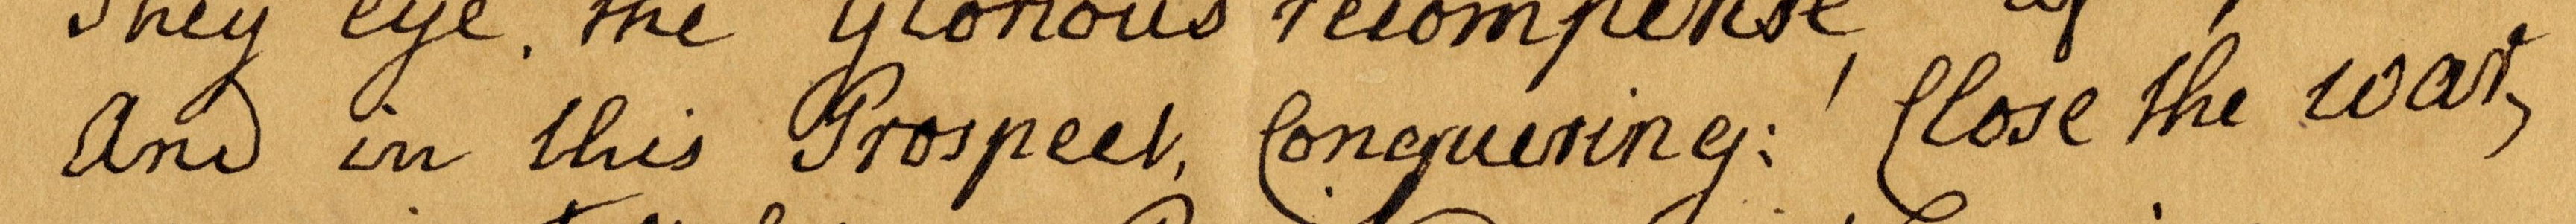And in this Prospect, Conquering: Close the war,
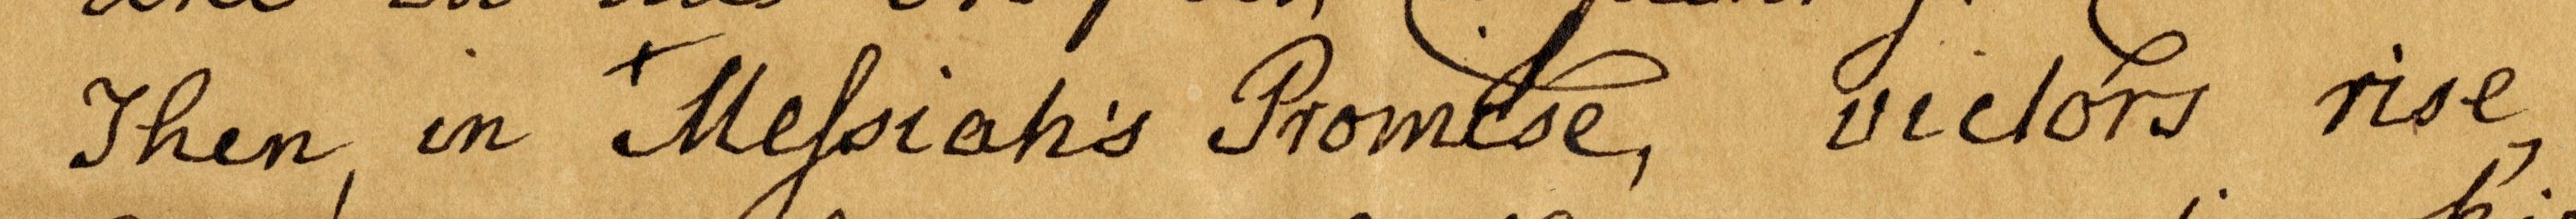Then, in + Messiah's Promise, victors rise,
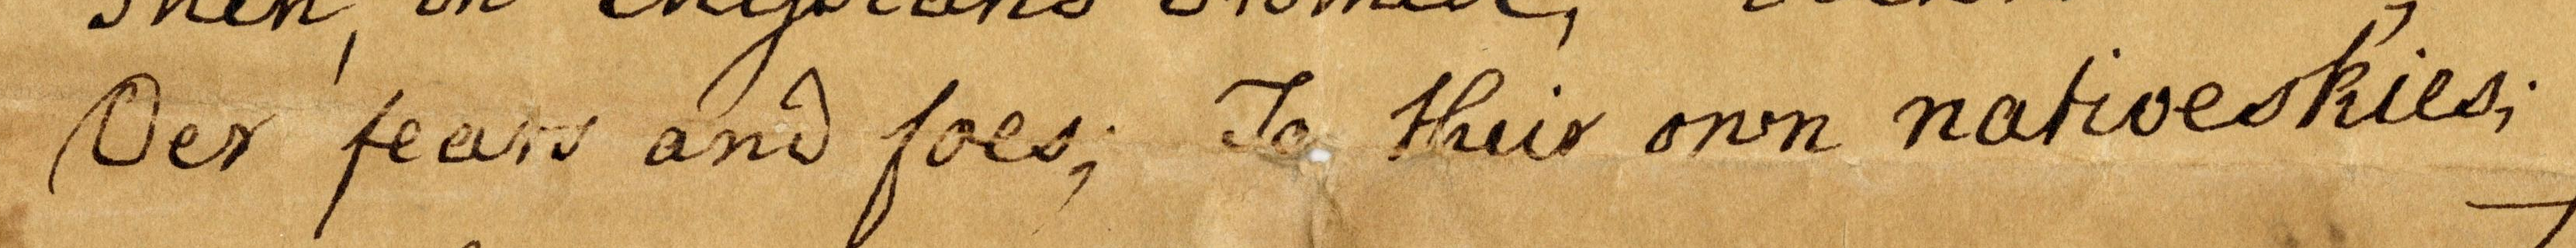Oer fears and foes; To their own nativeskies;
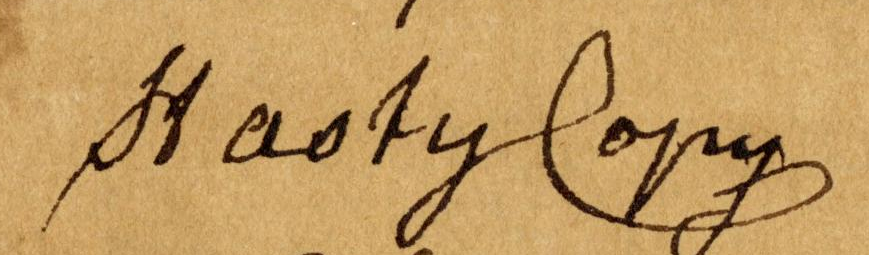Hasty Copy
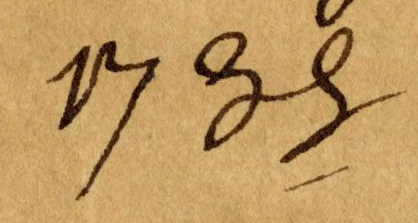1783
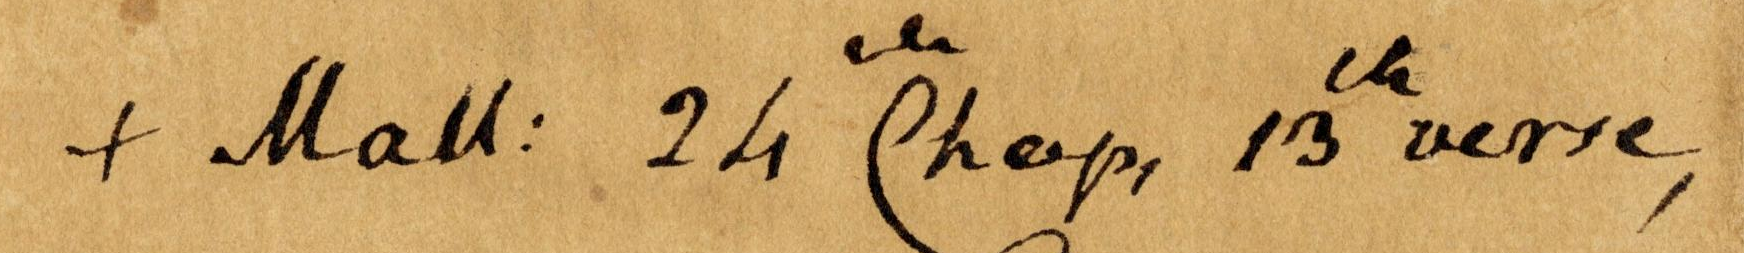+ Matt: 24^th Chap, 13^th verse,
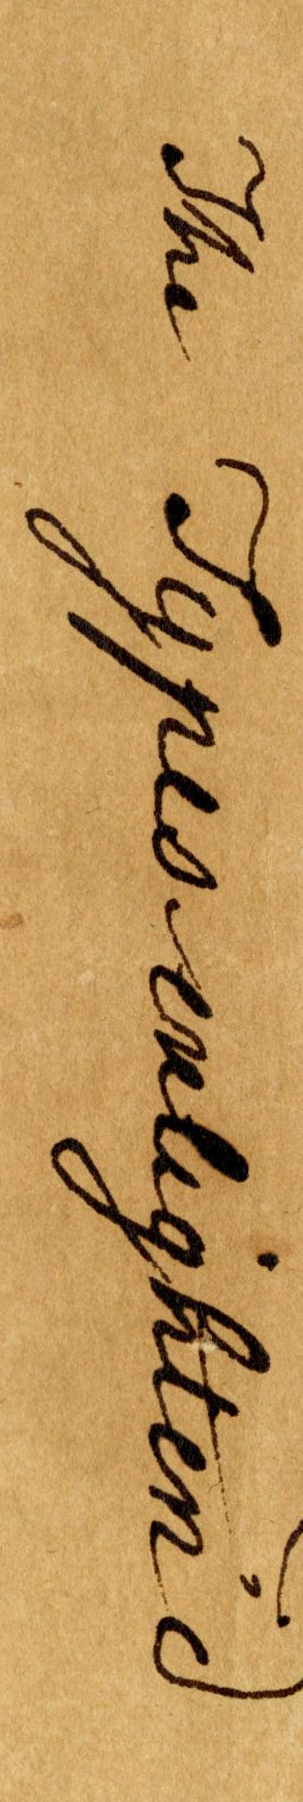The Types enlighten'd
